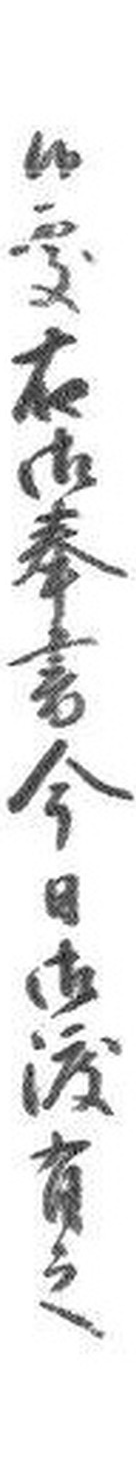候処右御奉書今日御渡有之
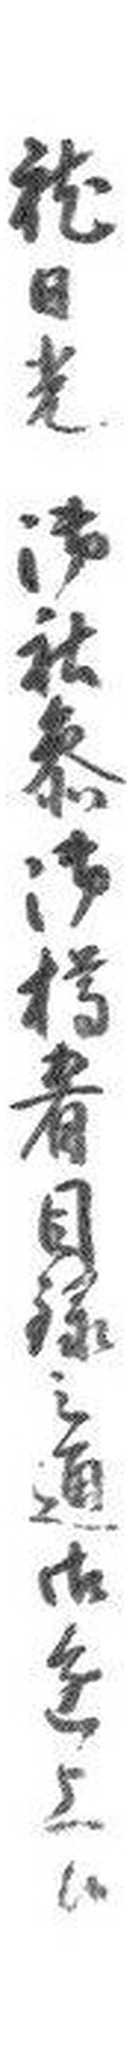就日光御社参御樽肴目録之通御進上候
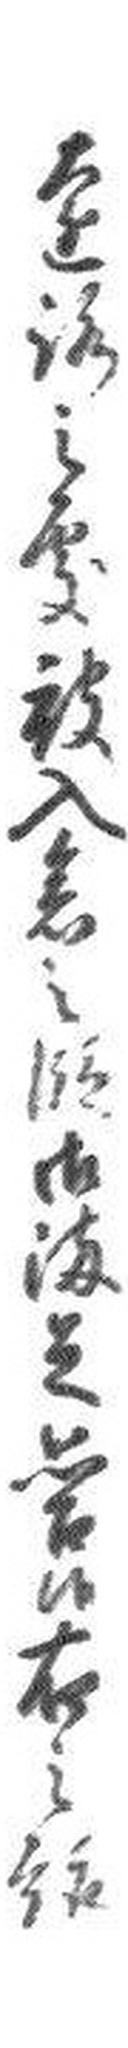遠路之処被入念之段御満足思召候右之趣
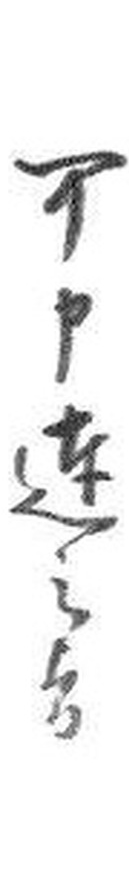可申達之旨
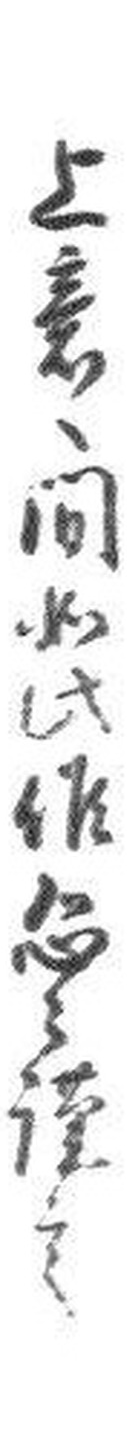上意候間如此候恐々謹言
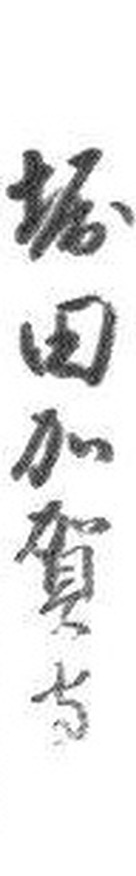堀田加賀守
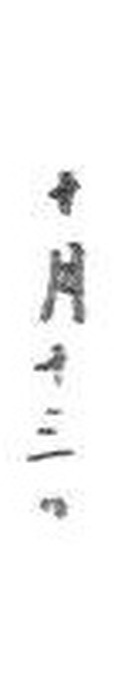十月十三日
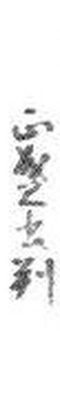正盛書判
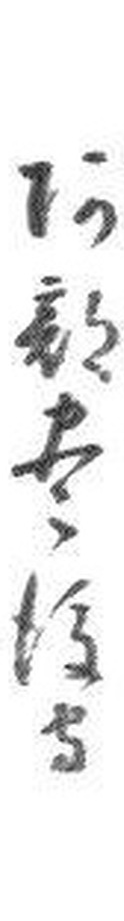阿部豊後守
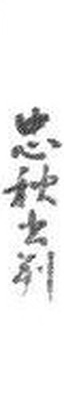忠秋書判
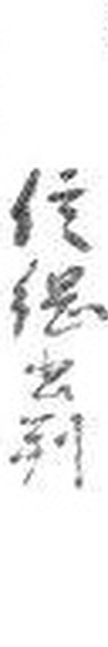信綱書判
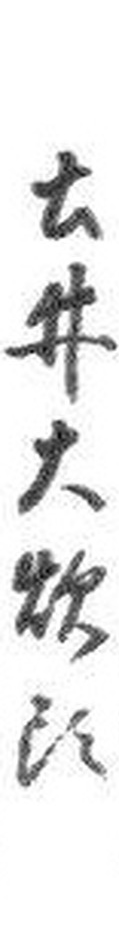土井大炊頭
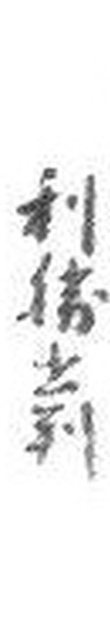利勝書判
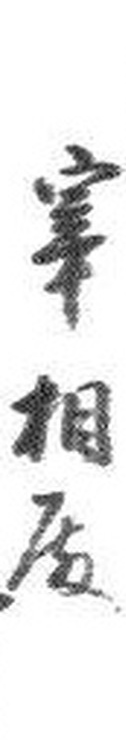宰相殿
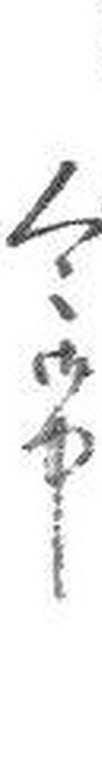人々御中

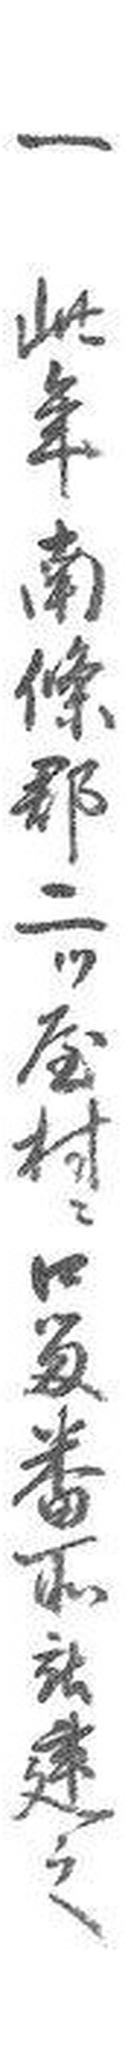一此年南条郡二ツ屋村ニ口留番所被建之
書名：家譜 四 忠昌公 従寛永七年到正保四年
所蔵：福井県文書館 Fukui Prefectural Archives
